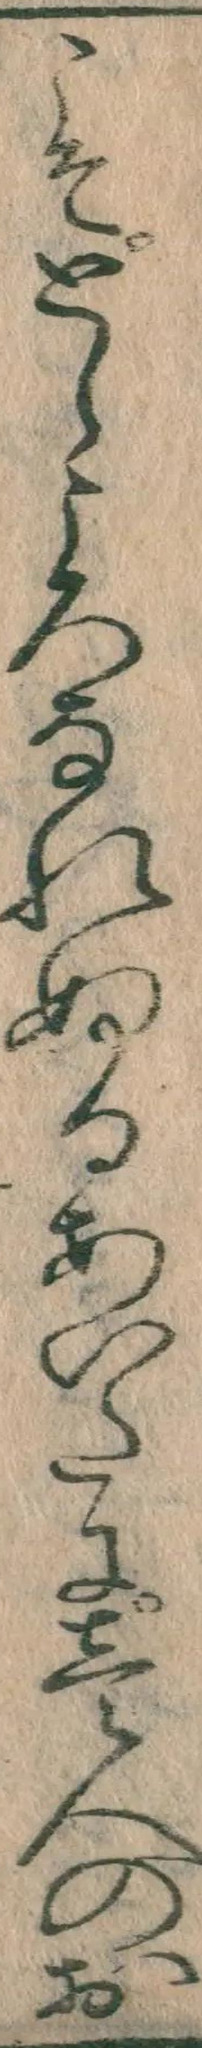こそ。としころなれぬるあいたに。壱人のお
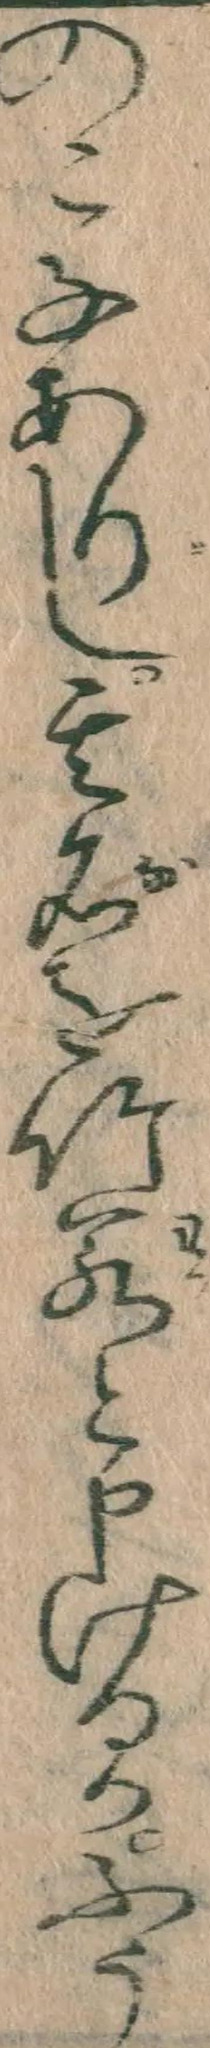の子ありし。其名を竹若と申けるか。ふう
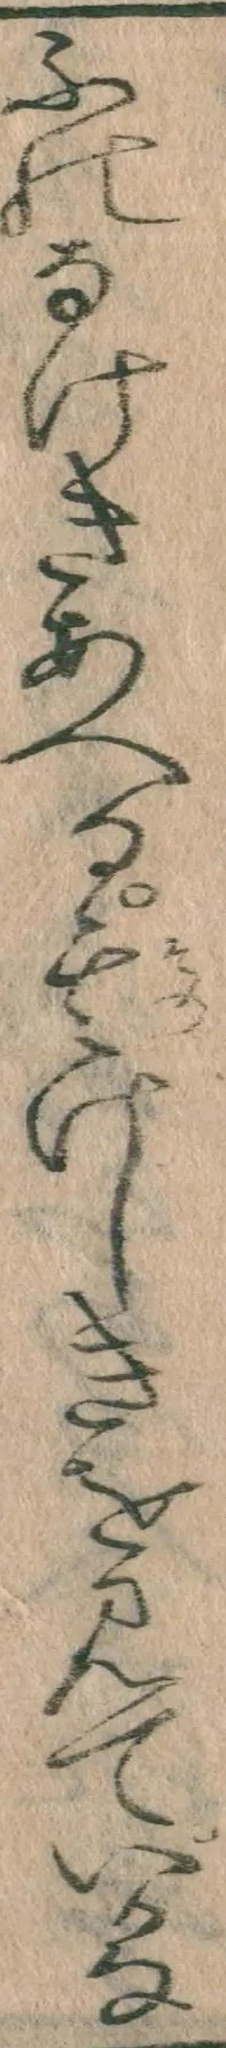ふのなけきあへる。其けしきを見て。いかな
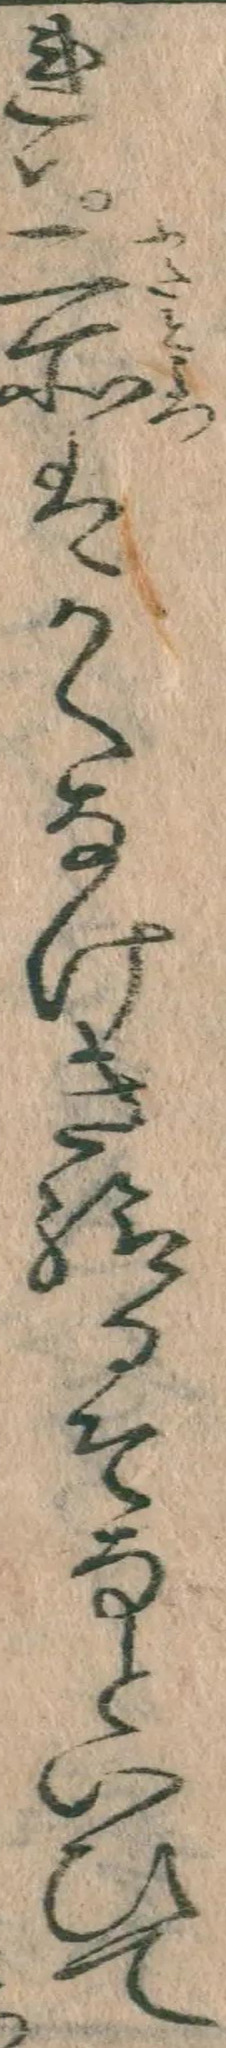れは。二所はかくなけき給るそなといひて
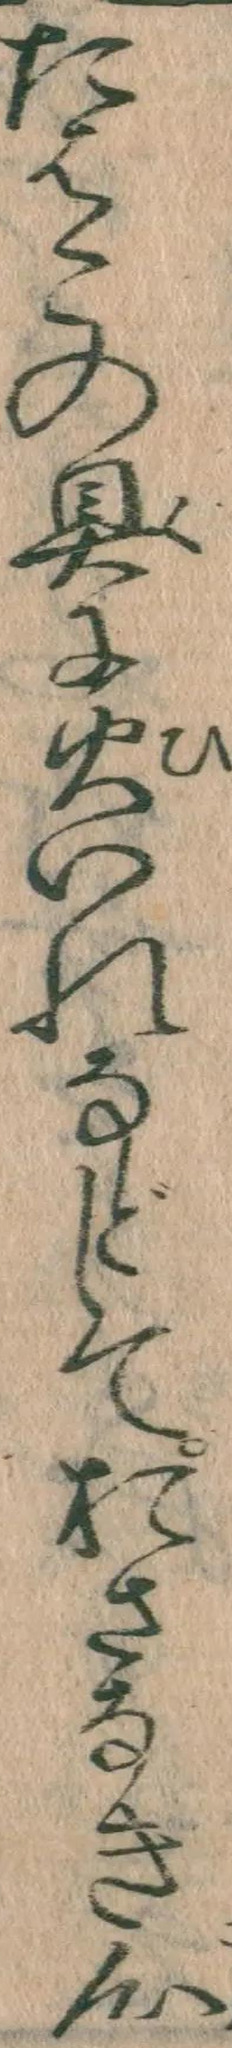たはこの具に火いれるなどして。おさなき心
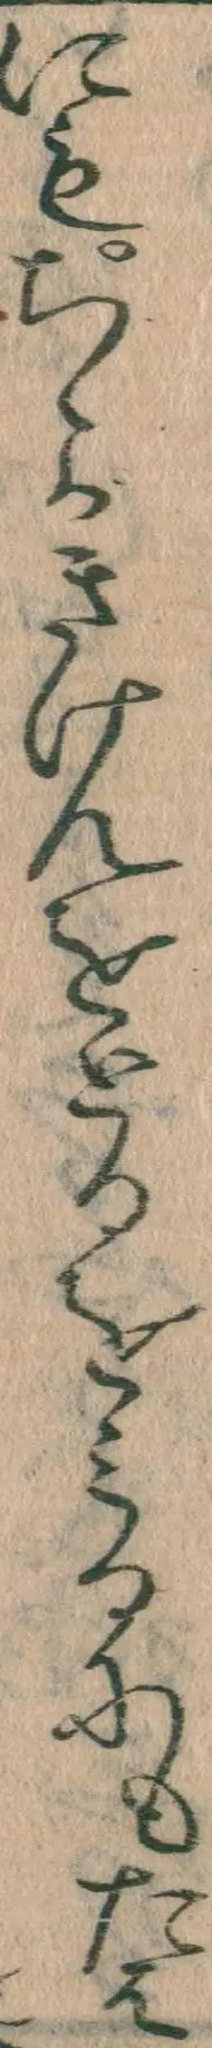にも。ちゝかきけんをとるをみるにもたは
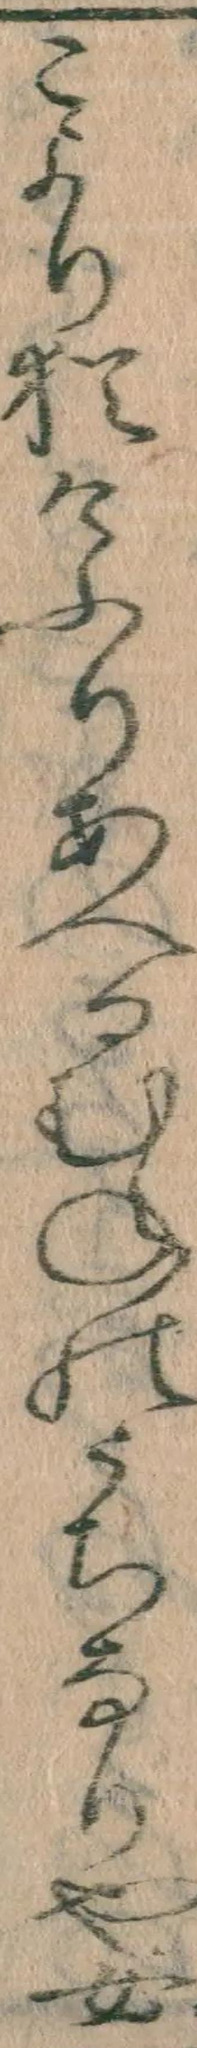こより猶けふりあへるむねのうちなりや。女
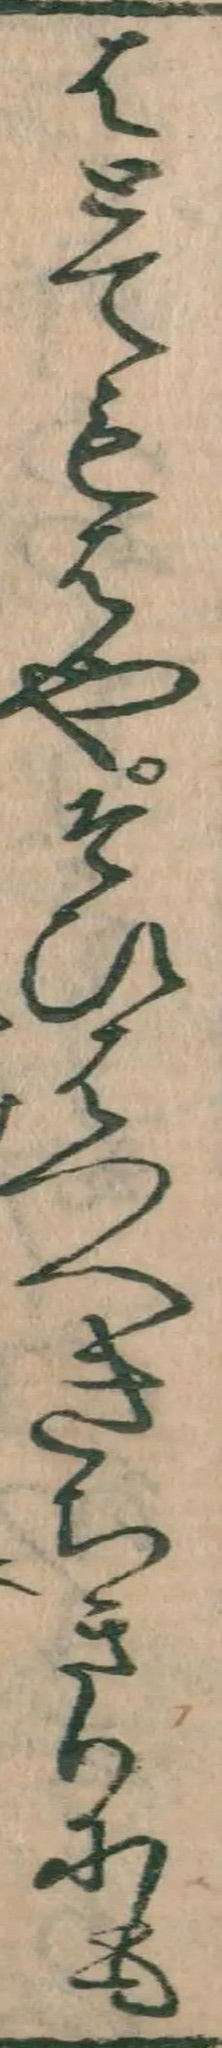はとてもはや。そひはつへきちきりにも
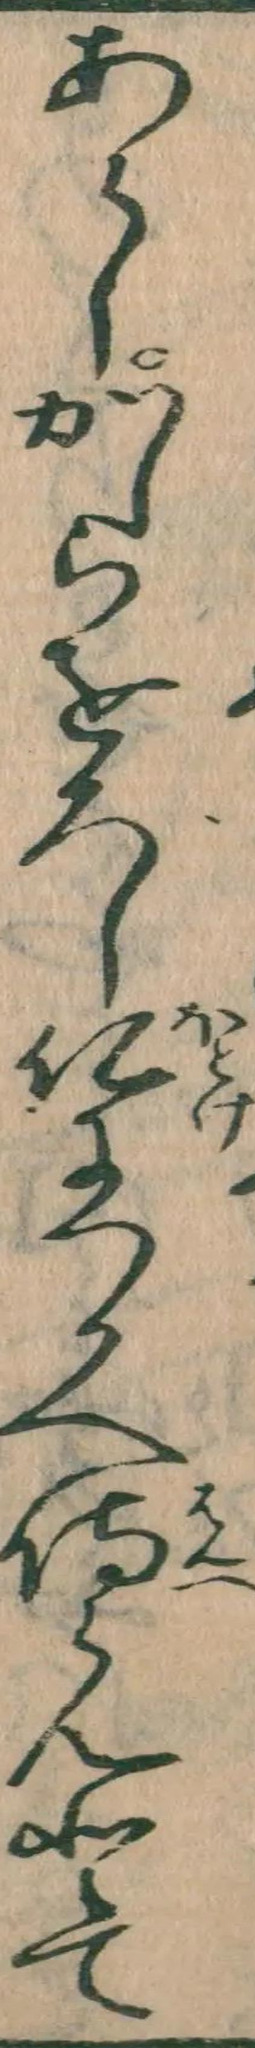あらし。かしらをろし仏につかへ侍らんとて
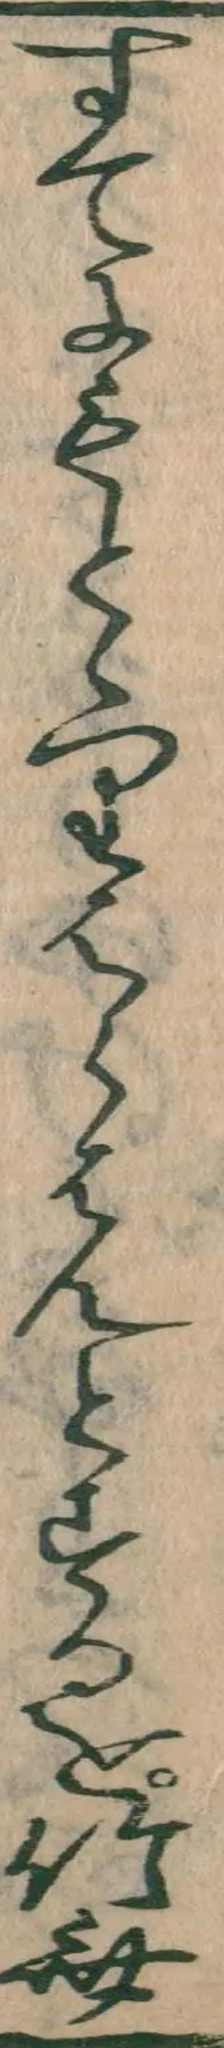すてにもとゝりはらはんとするを。竹斎
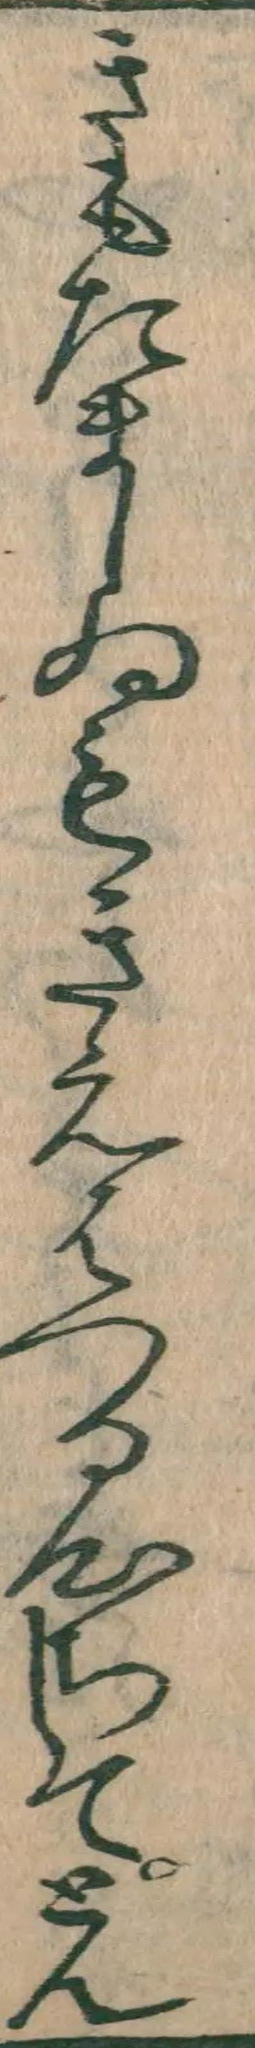きもたましゐもきえはつる心ちして。とん
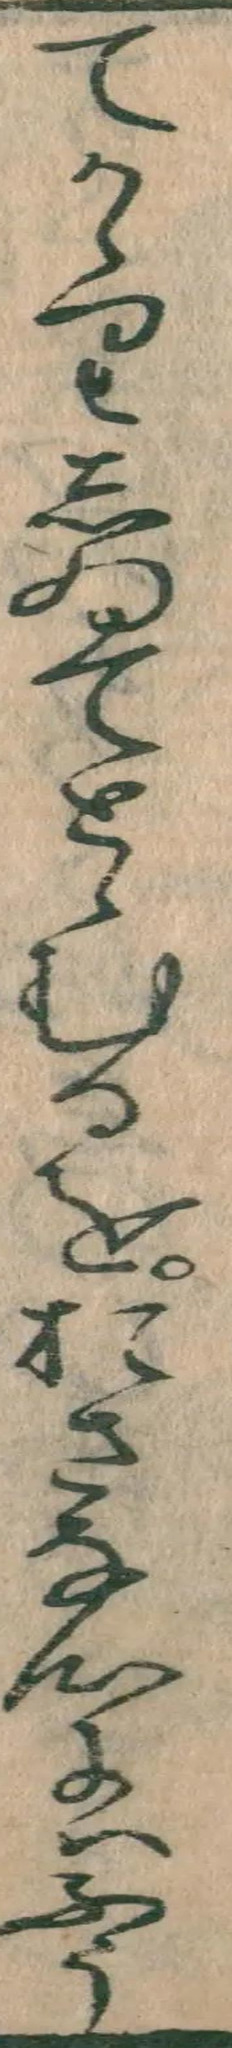てかゝりしゐてとゝむるを。おさな心にはふう
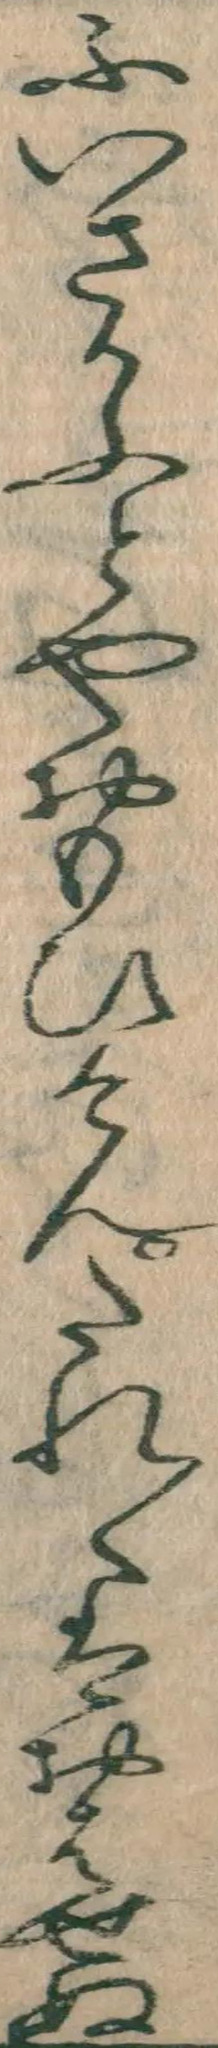ふいさかふとやおもひけん。たれ〳〵はおはせぬ
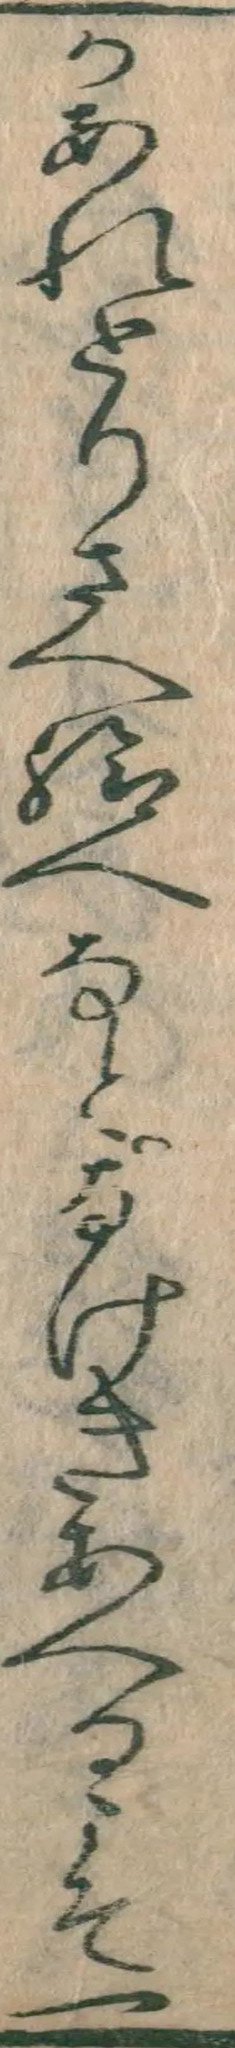かあれとりさへ給へなと。なけきあへるこそ一
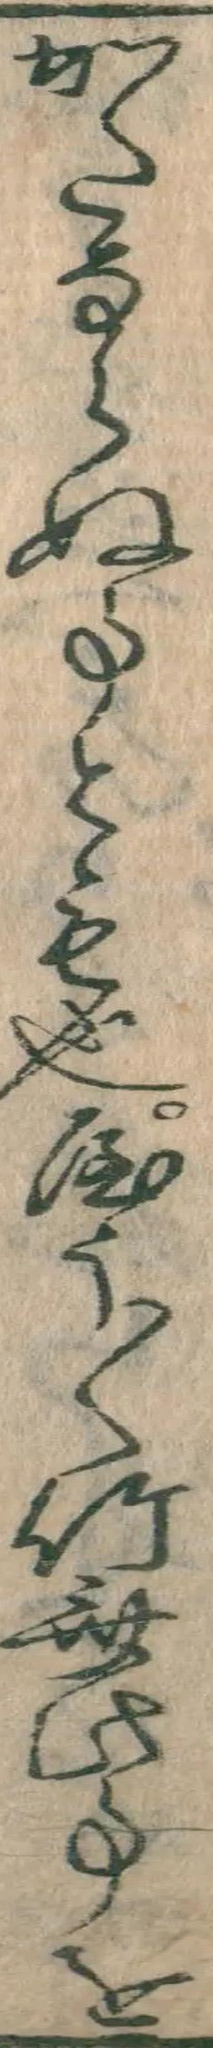かたならぬ事とも也。やう〳〵竹斎此事を
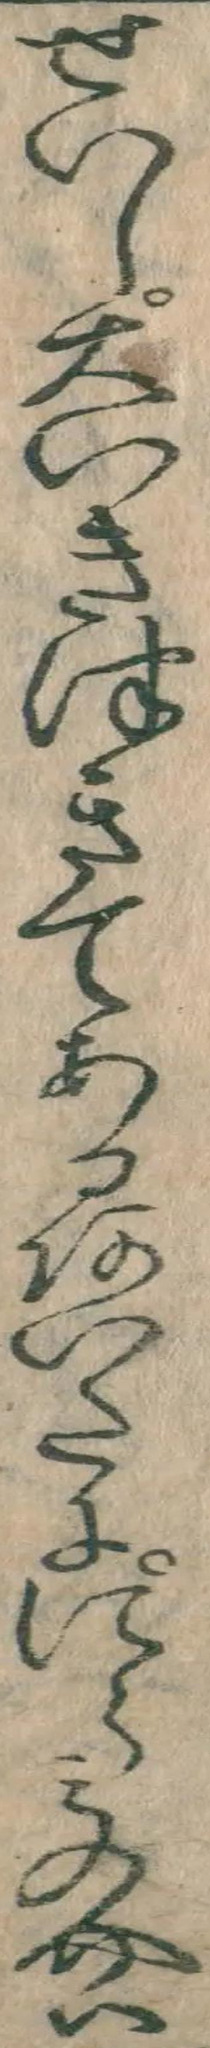せいし。大いきつきてあるあいたに。にらみの介は
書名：竹斎狂歌物語 3巻
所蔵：国立国会図書館 National Diet Library, JAPAN
